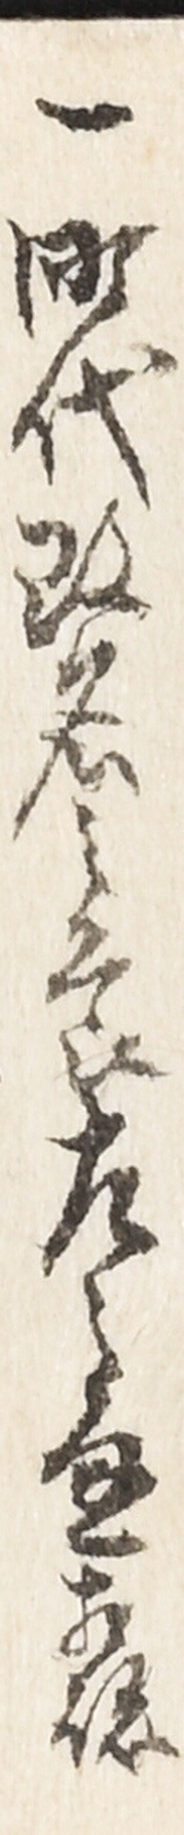一町代改名之節左之通相認
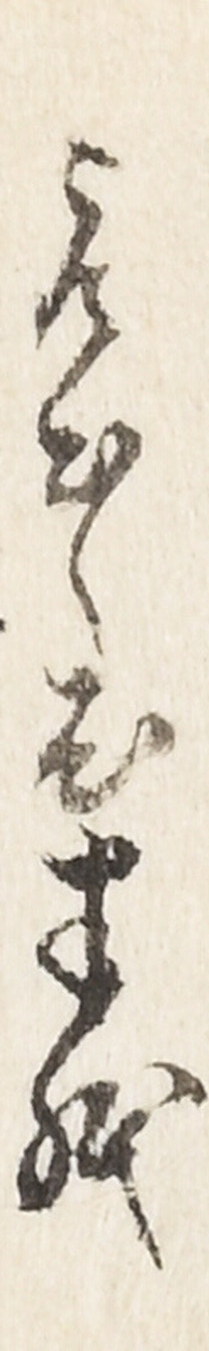差出し尤半紙
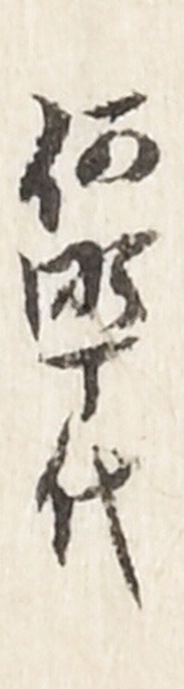何町丁代
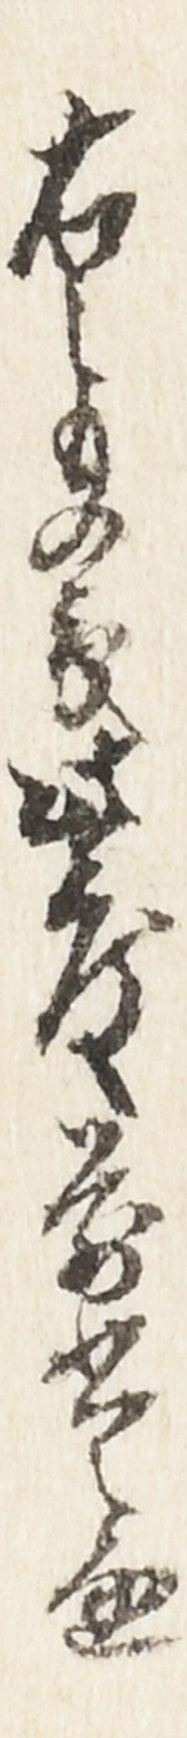右之もの義此度々前書之通
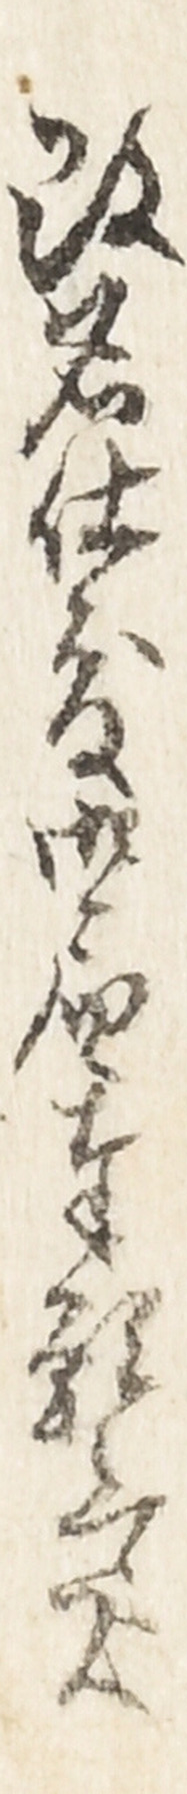改名仕度御届奉願上候以上
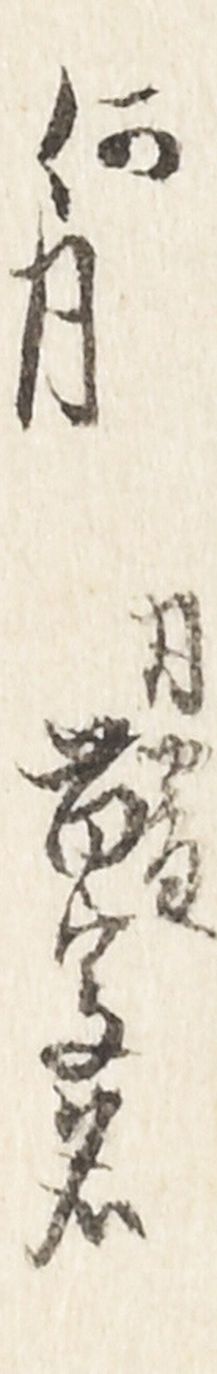何月苗字名

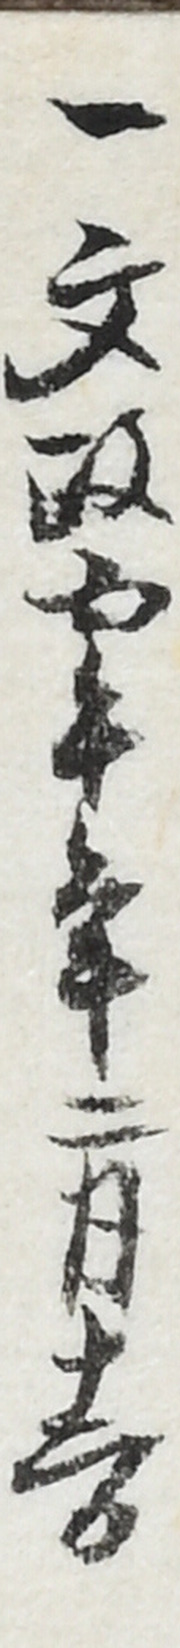一文政五午年二月十二日
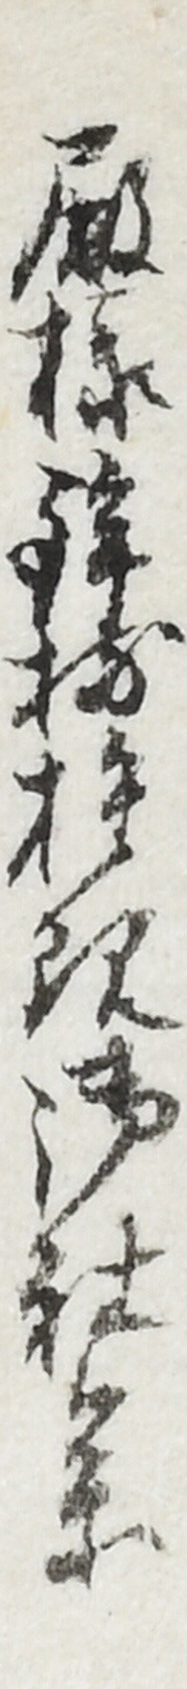殿様鉾持権現御社参
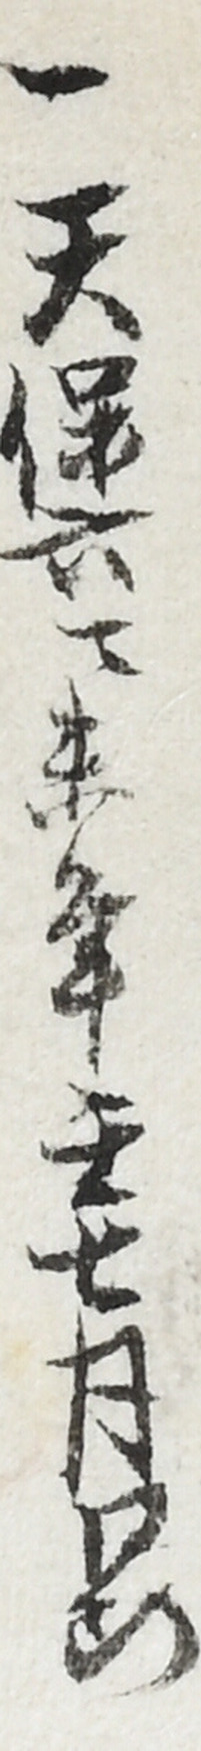一天保六乙未年壬七月同断
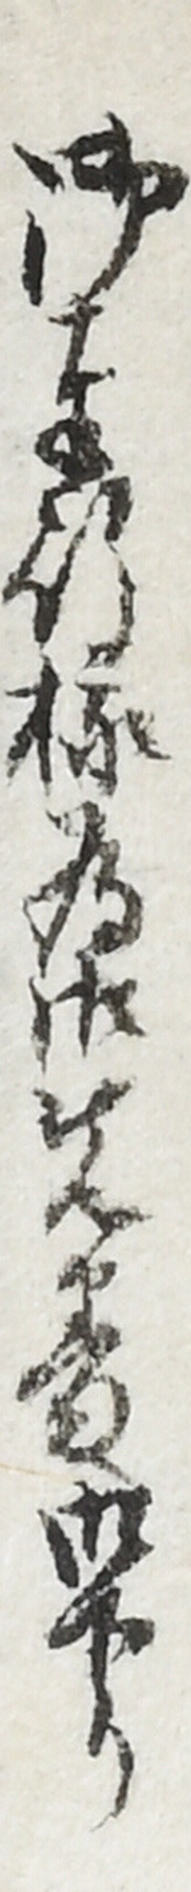御奉行様為御先番御下り
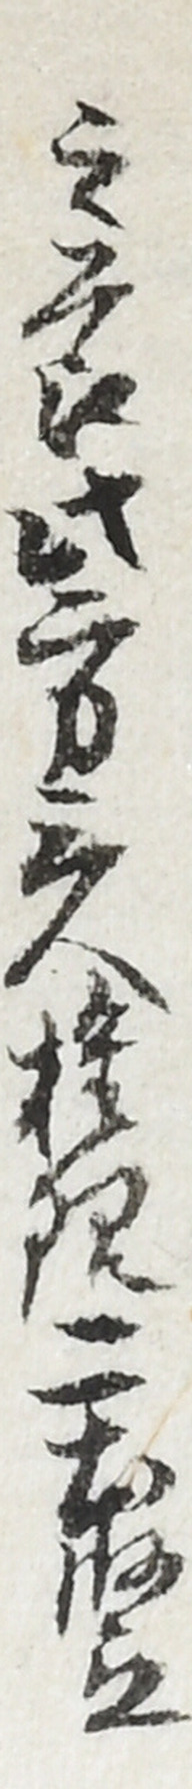之節此方三人権現二本堅
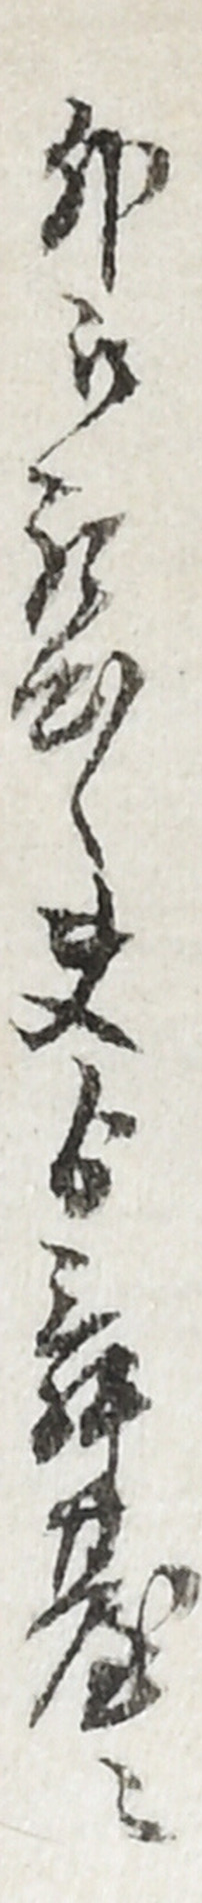外江罷出候夫より舞台ニ
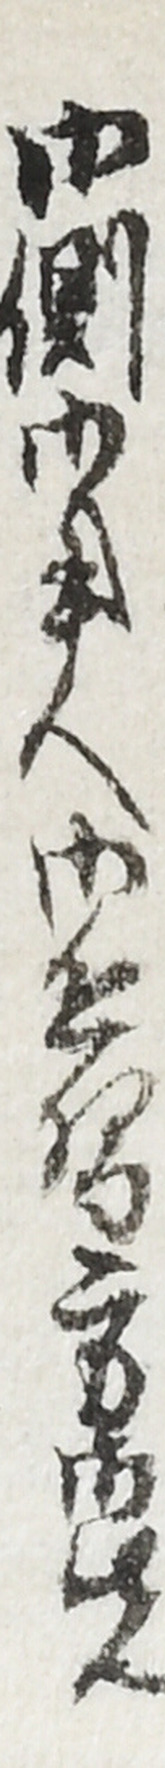御側御用人御近習方御先
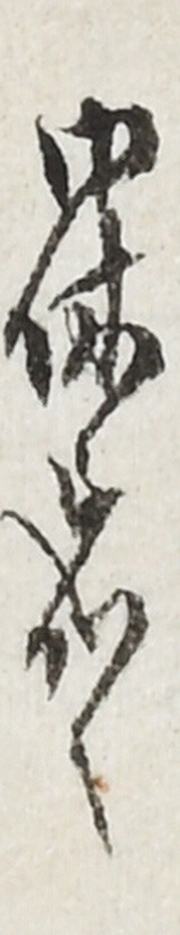御休被成候
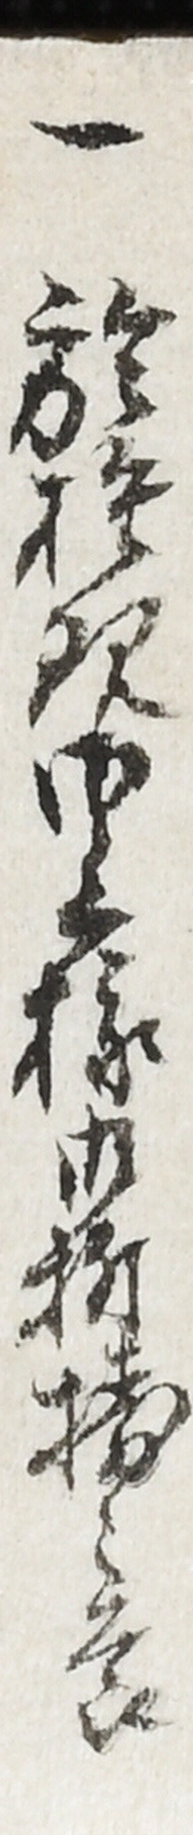一於権現御上様御折祷之節
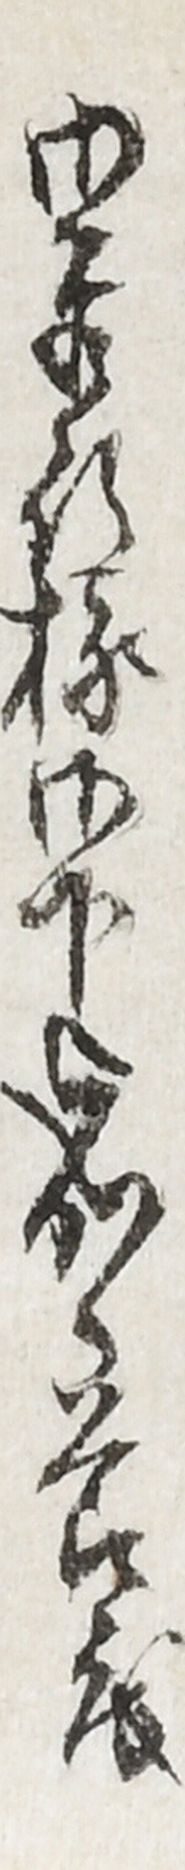御奉行様御下被成候節も
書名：年内行事懐中録
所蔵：伊那市立高遠町図書館・合同会社AMANE
